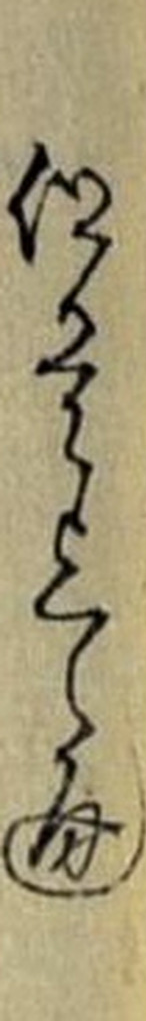但是迄之通
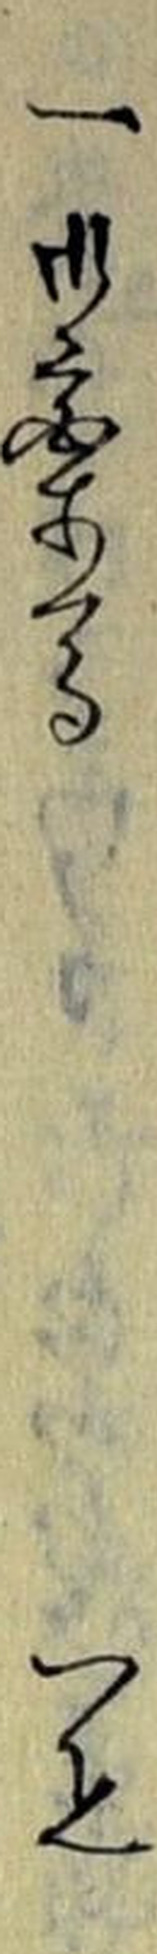一御牽馬一疋
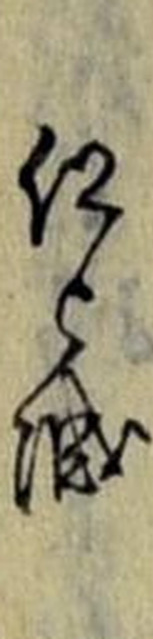但被減
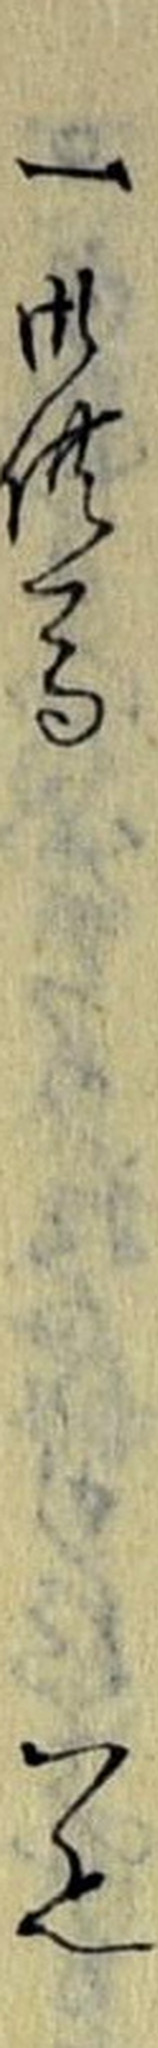一御供馬一疋
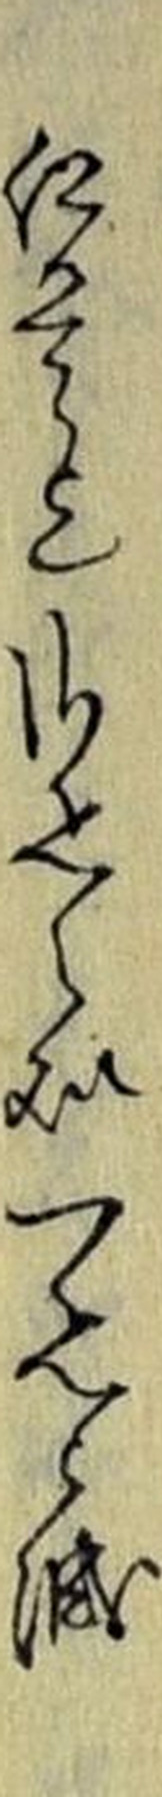但是迄弐疋之処一疋被減
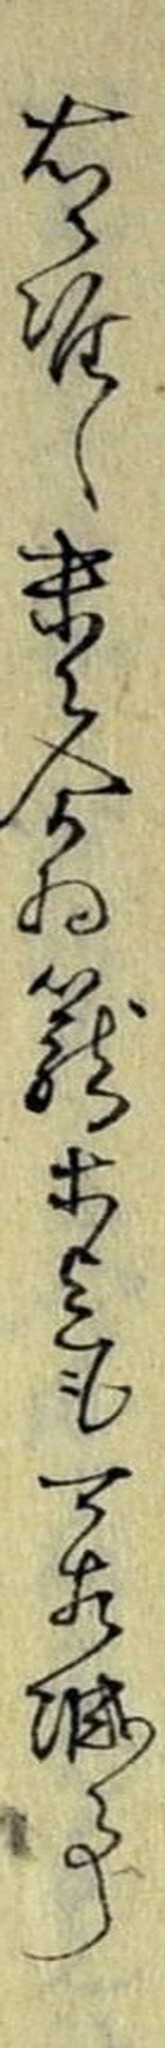右ニ准し末々合羽籠等迄も可相減事
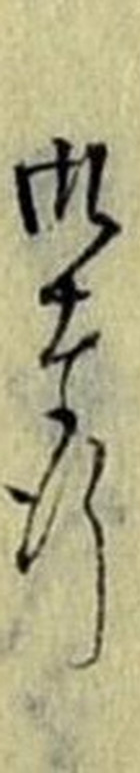御奉行
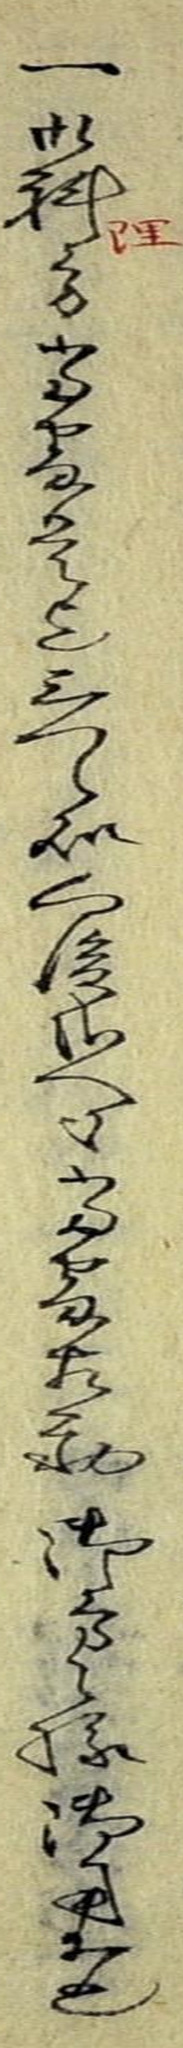一御料理方当番是迄三人之処向後弐人ツヽ当番相勤御方々様御用而巳
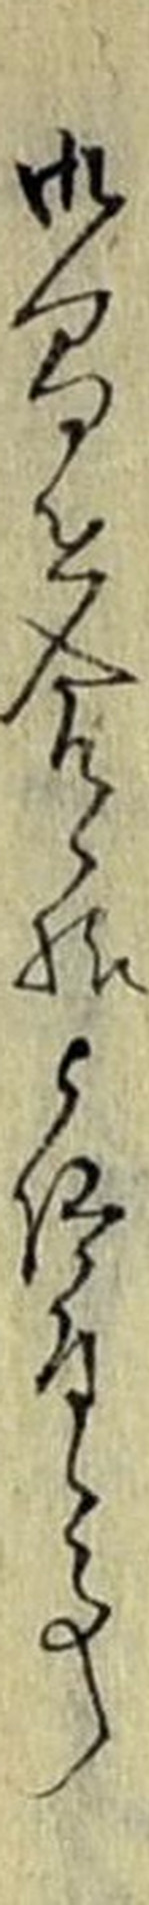御間を合候様被仰付候事
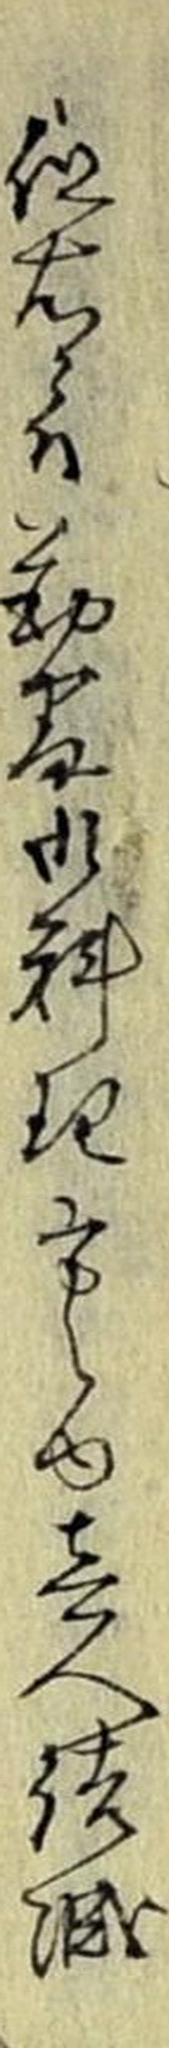但右ニ付勤番御料理方之内壱人詰減
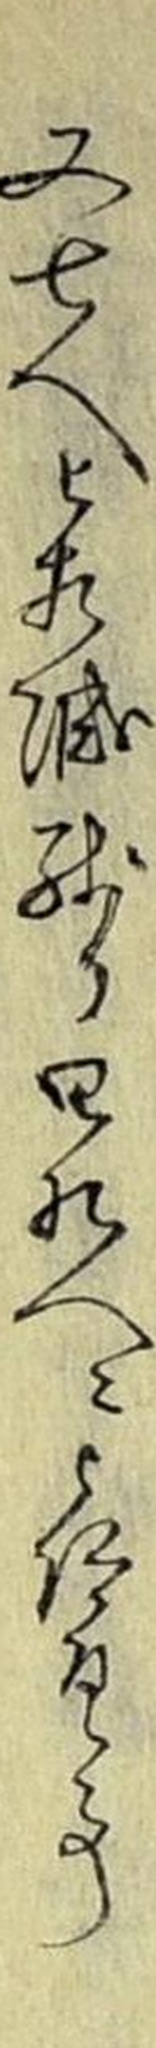又七人被減残り四拾人ニ被仰付候事
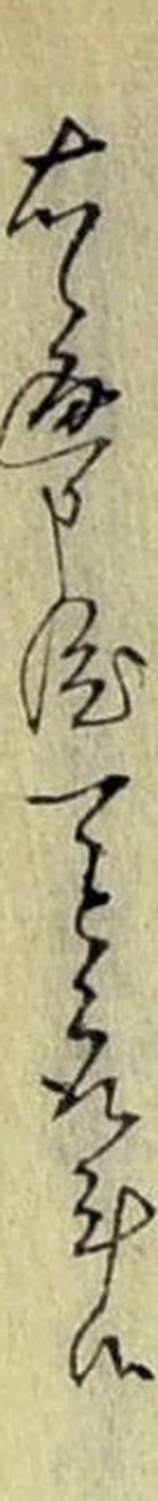右之通申渡可被取計候
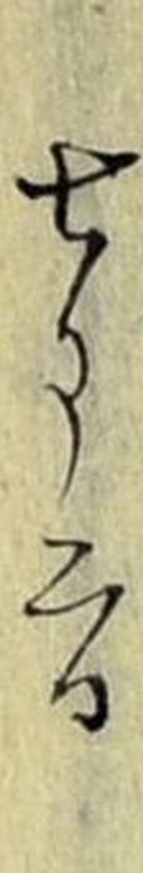七月二日
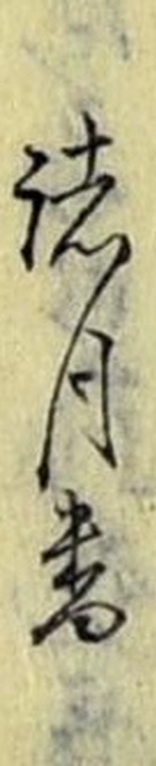諸月番

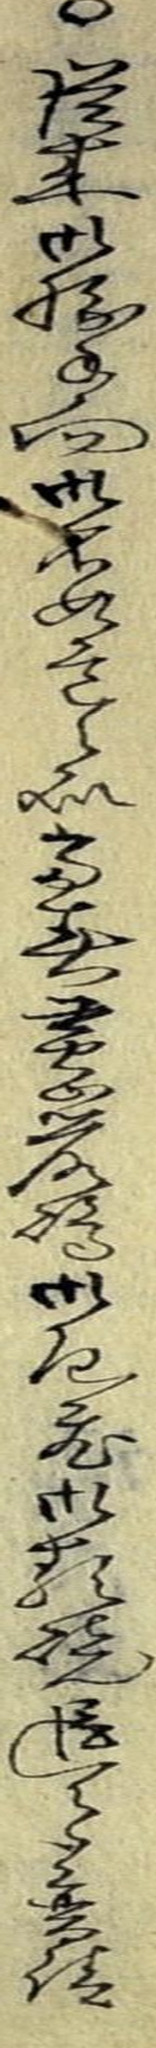○従来御勝手向御不如意之処当春霊巌島御屋敷御類焼追々御普請
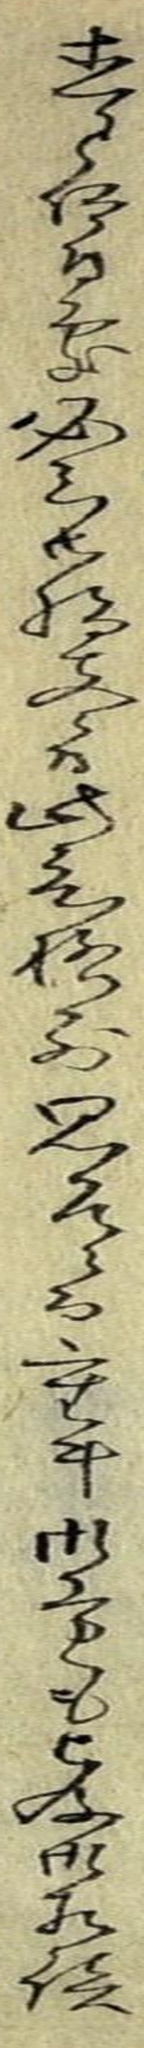直被仰付候処必至御指支ニ付此度格別思召ニ而重キ御方へも被為相談
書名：命令之部 五
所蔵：福井県文書館 Fukui Prefectural Archives
